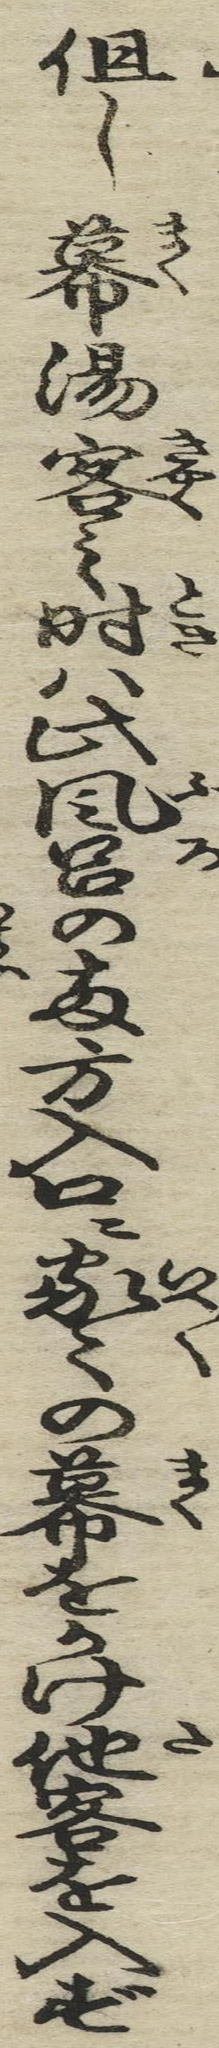但し幕湯客の時は風呂の両方入口に家々の幕をかけ他客を入ず
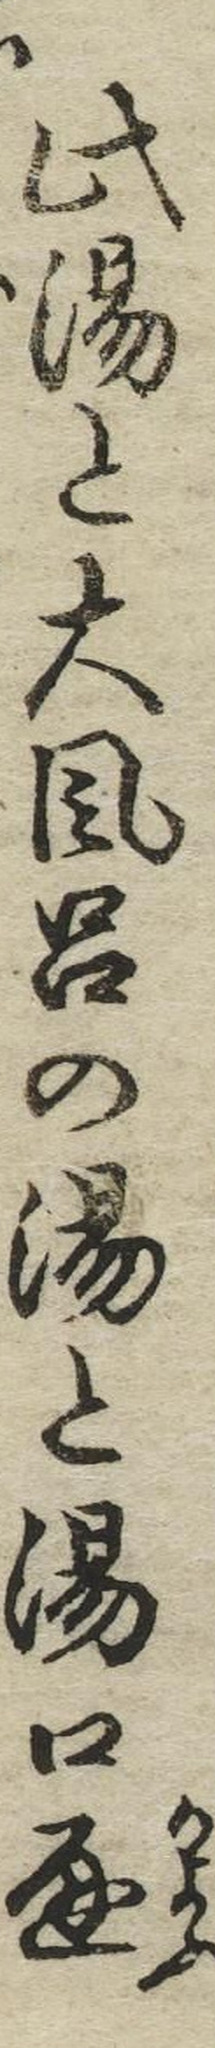此湯と大風呂の湯と湯口通
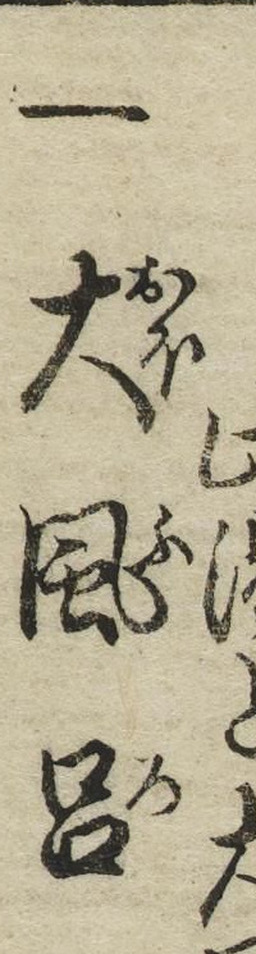一大風呂

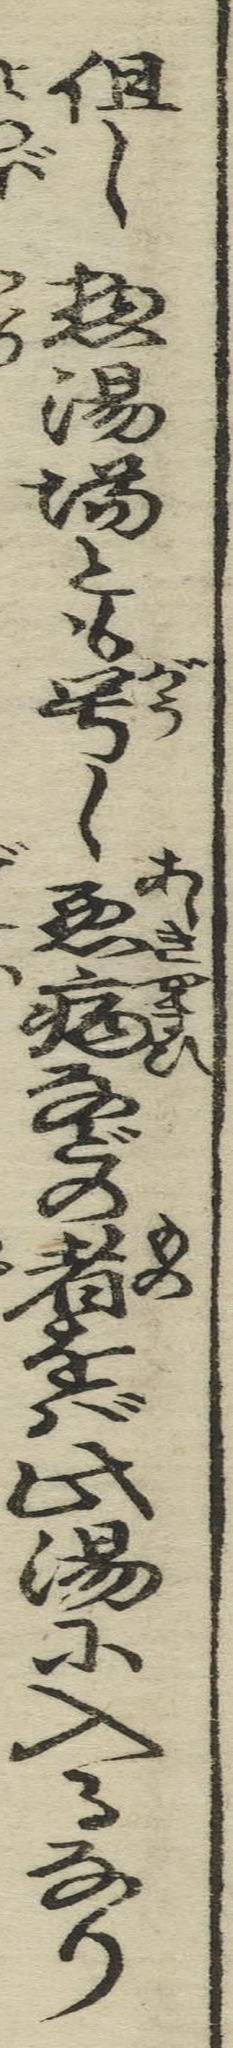但し惣湯場とも号し悪病などの者をば此湯に入るなり
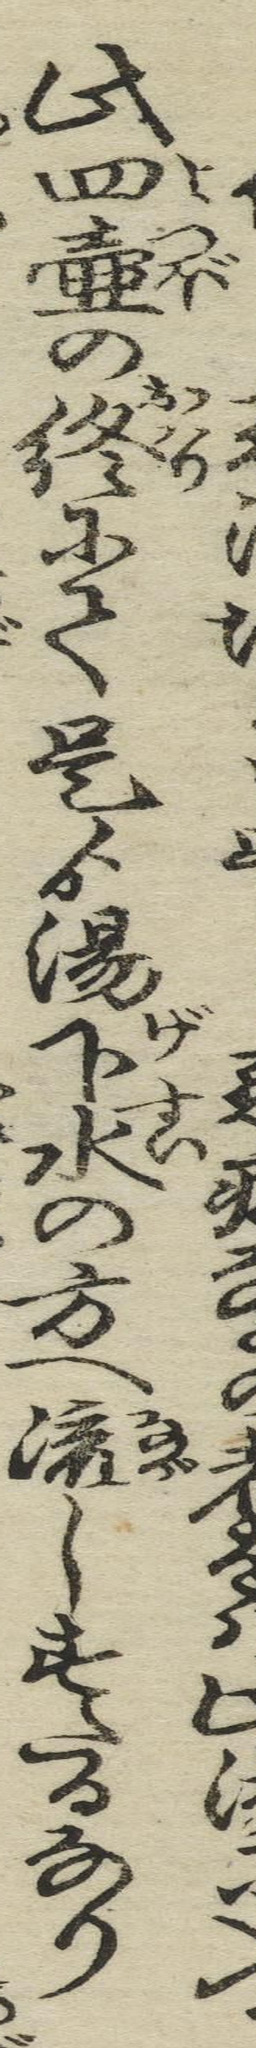此四壷の終にて是より湯下水の方へ流しすてるなり
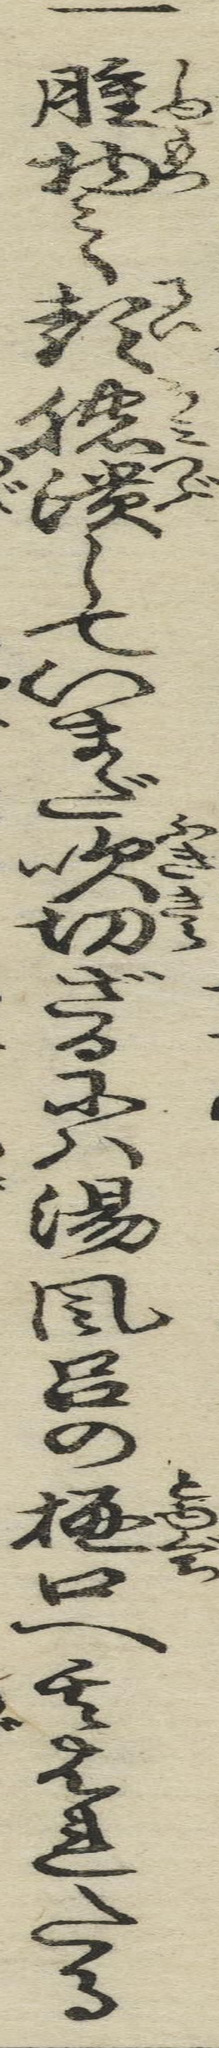一腫物の類膿潰していまだ吹切ざるには湯風呂の樋口へ其はれたる
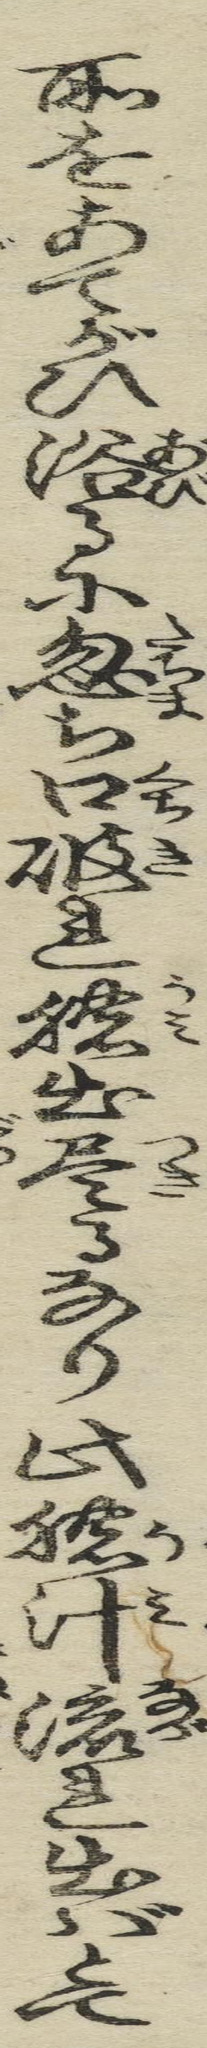所をあてがひ浴るに忽ち口破れ膿出尽るなり此膿汁流れ出ばとて
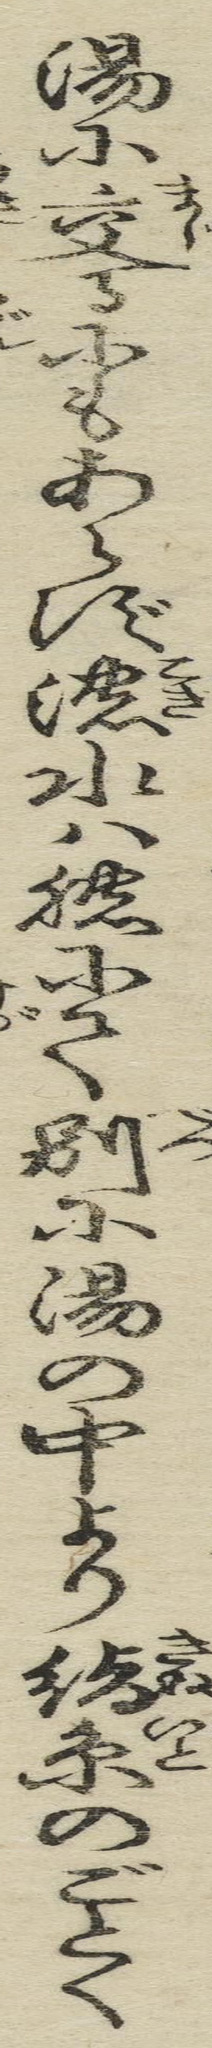湯に交るにもあらず濃水は膿にて別に湯の中より絹糸のごとく
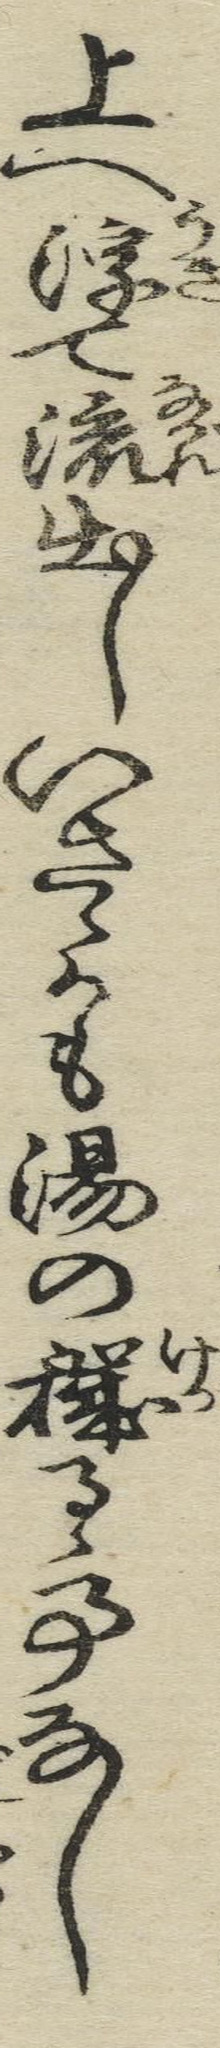上へ浮て流出しいさゝかも湯の穢るゝ事なし
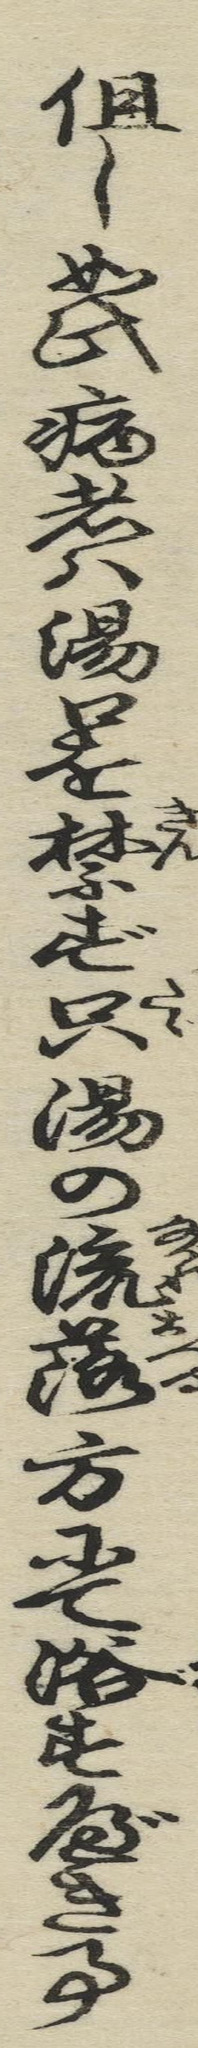但し如此病者は湯口を禁ず只湯の流落方にて浴すべき事
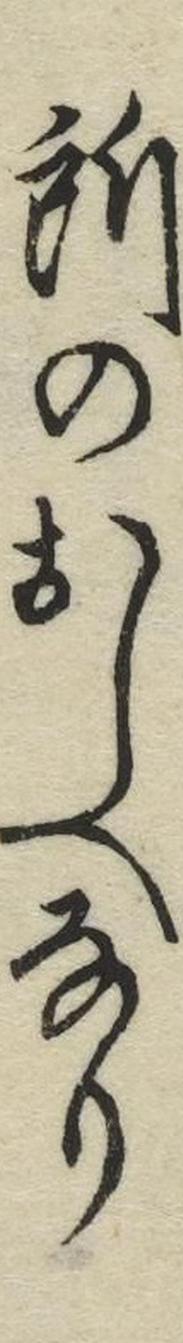所のおしへなり
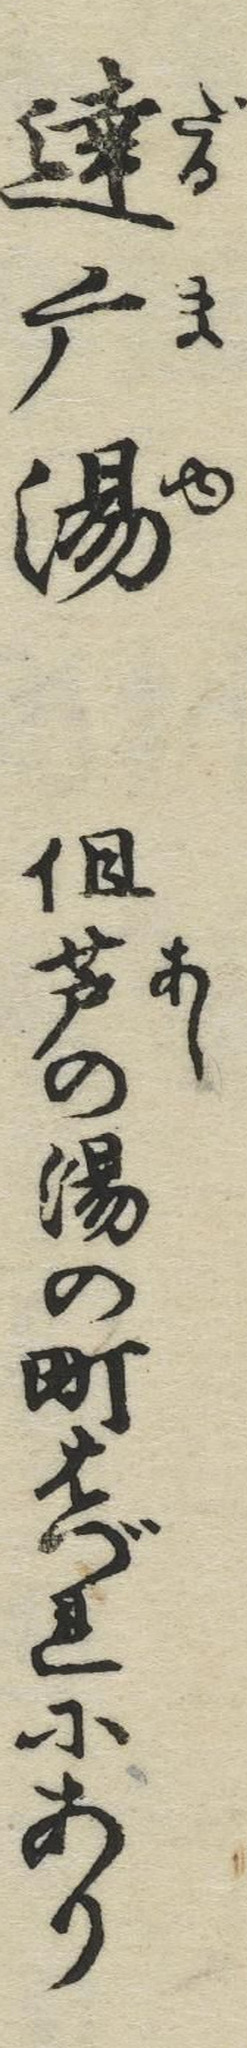達广湯但芦の湯の町はづれにあり
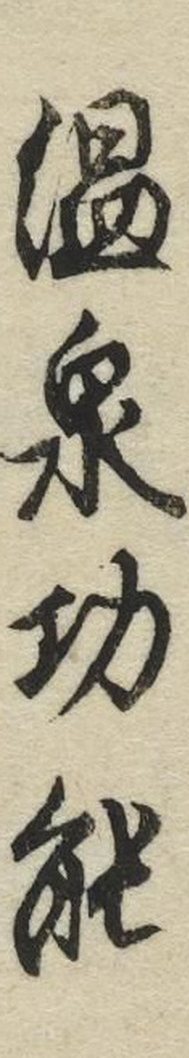温泉功能
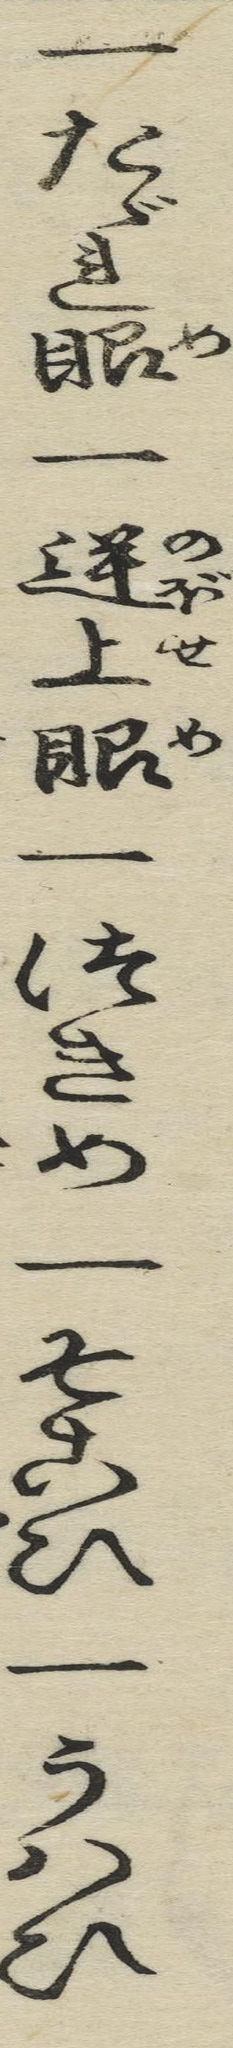一たゞれ眼一逆上眼一つきめ一そこひ一うはひ
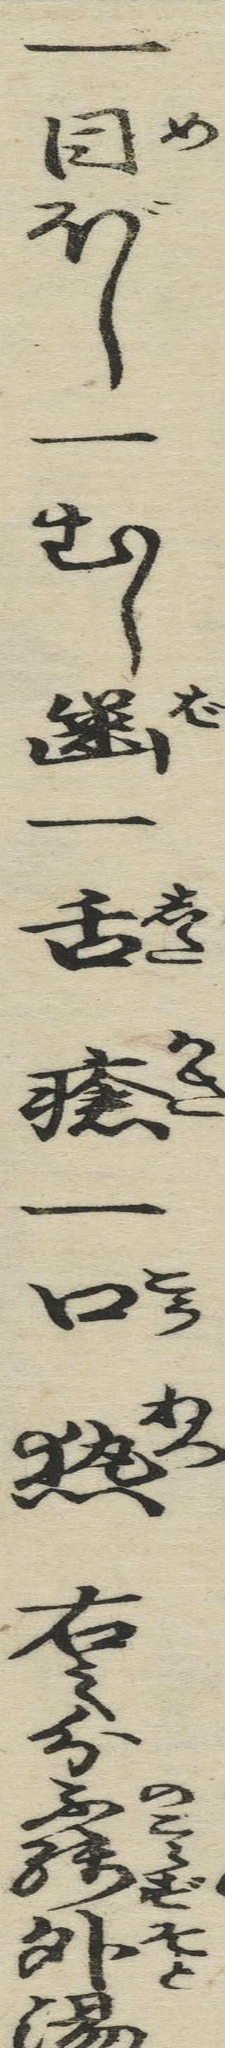一目ぼし一むし歯一舌瘡一口熱右の分不残外湯
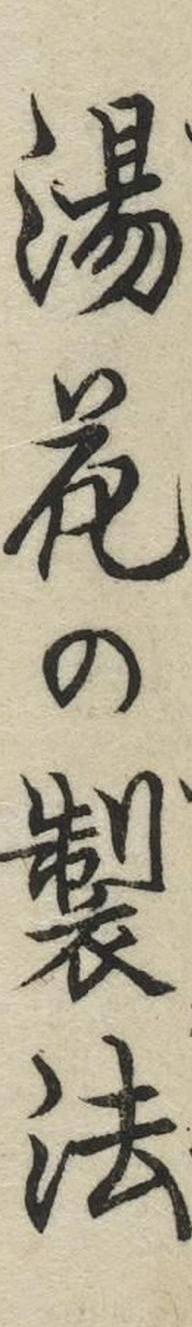湯花の製法
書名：箱根七湯　温泉圖會　全
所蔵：東京大学地震研究所図書室 Earthquake Research Institute Library, The University of Tokyo, JAPAN
